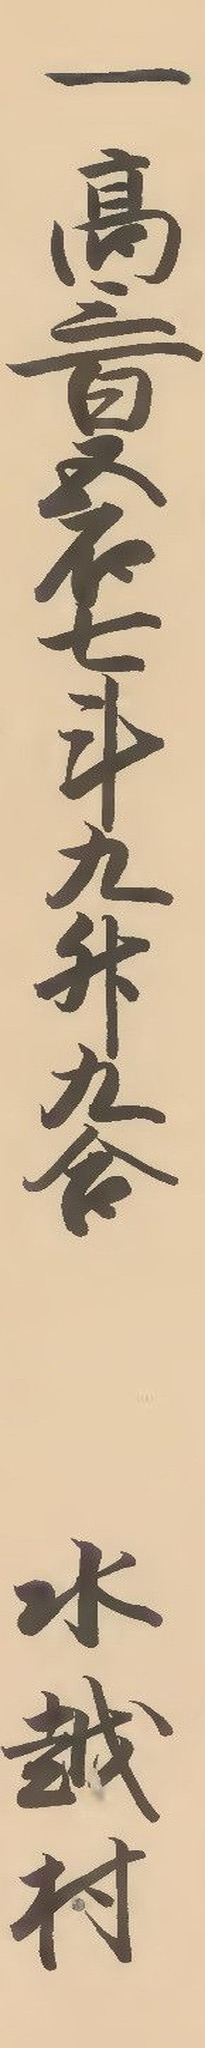一高三百五石七斗九升九合水越村
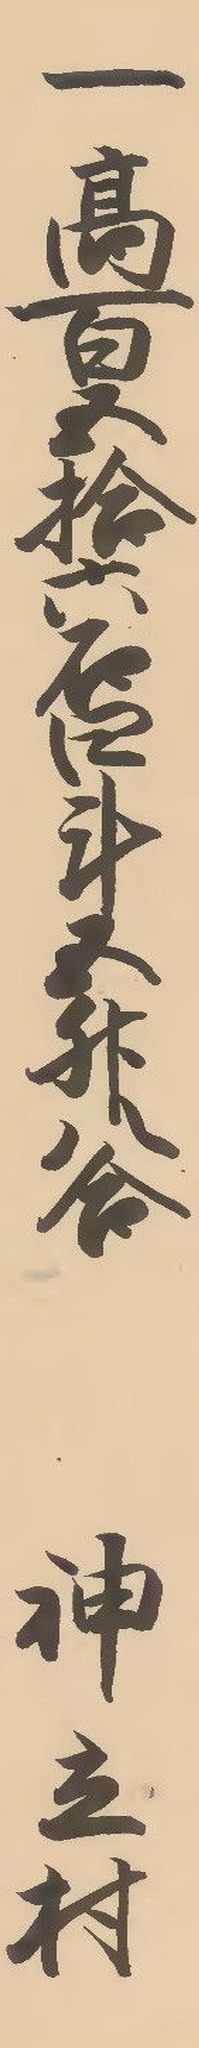一高百五拾六石四斗五升八合神立村
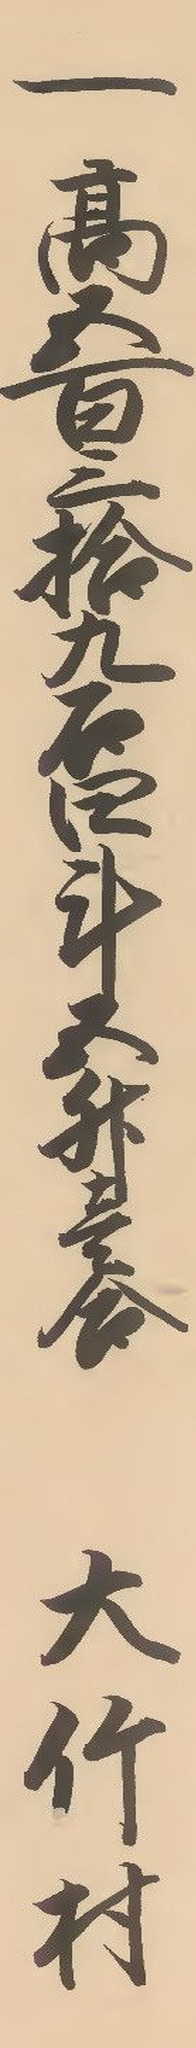一高五百三拾九石四斗五升壱合大竹村
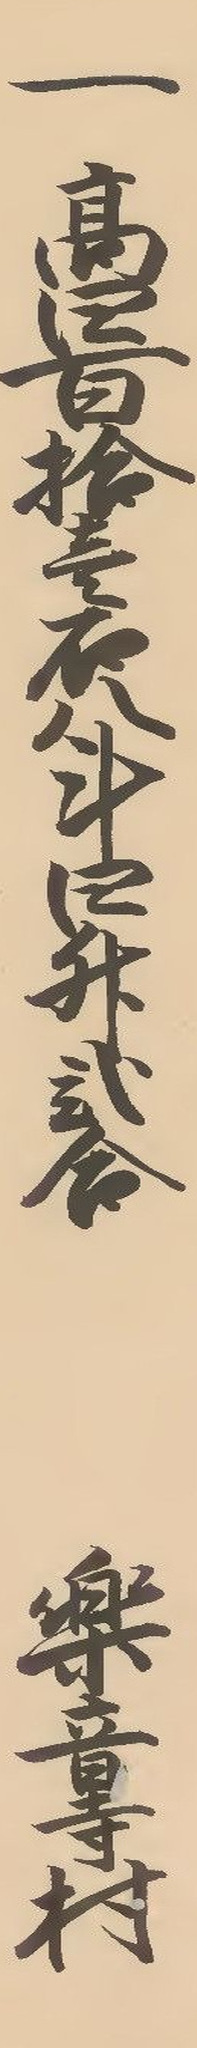一高四百拾壱石八斗四升弐合楽音寺村
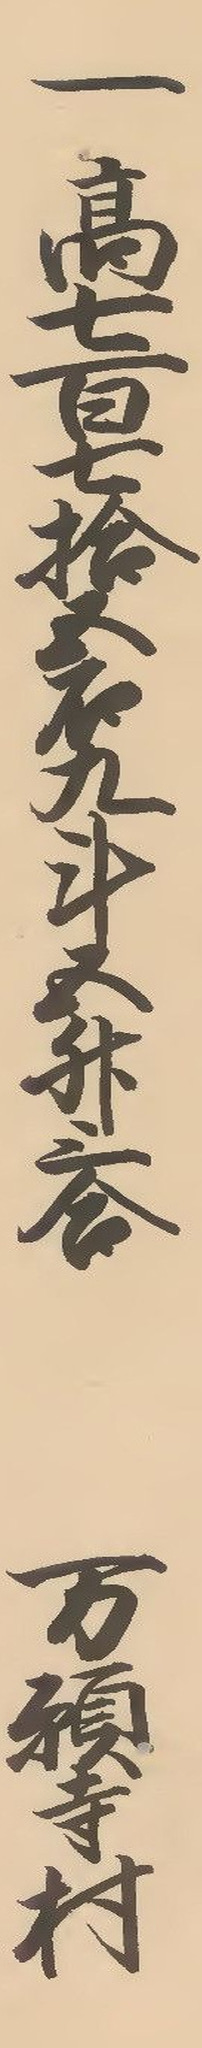一高七百七拾五石九斗五升三合万願寺村
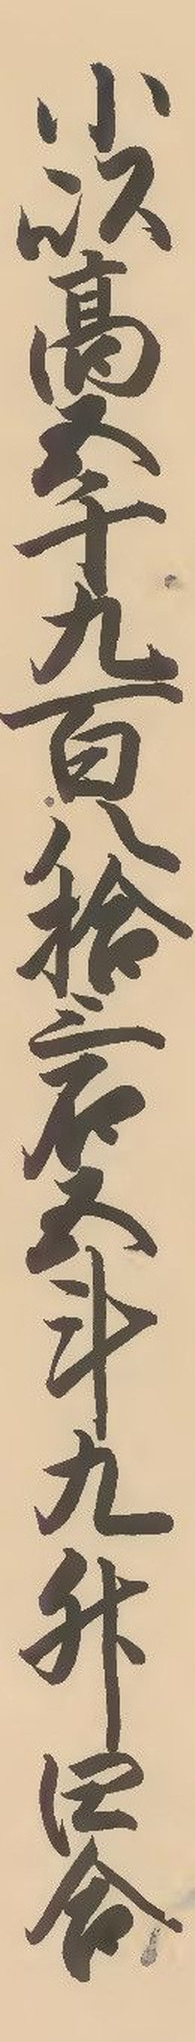小以高五千九百八拾三石五斗九升四合

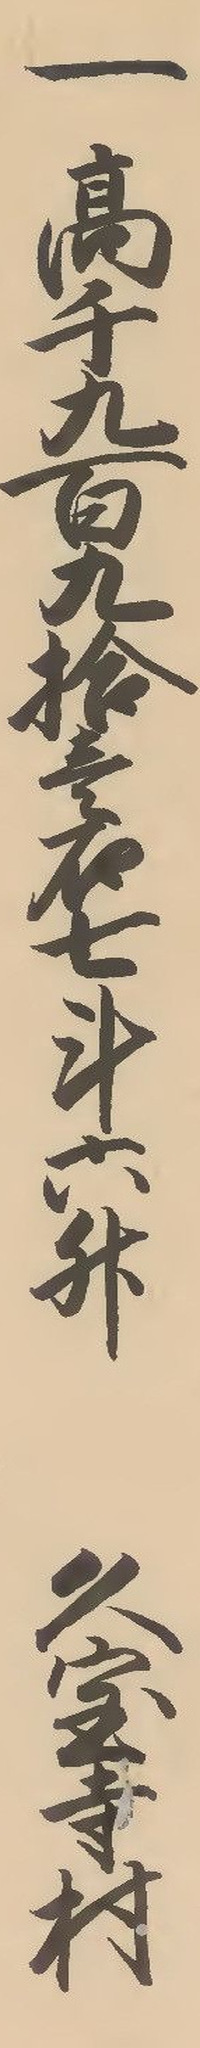一高千九百九拾壱石七斗六升久宝寺村
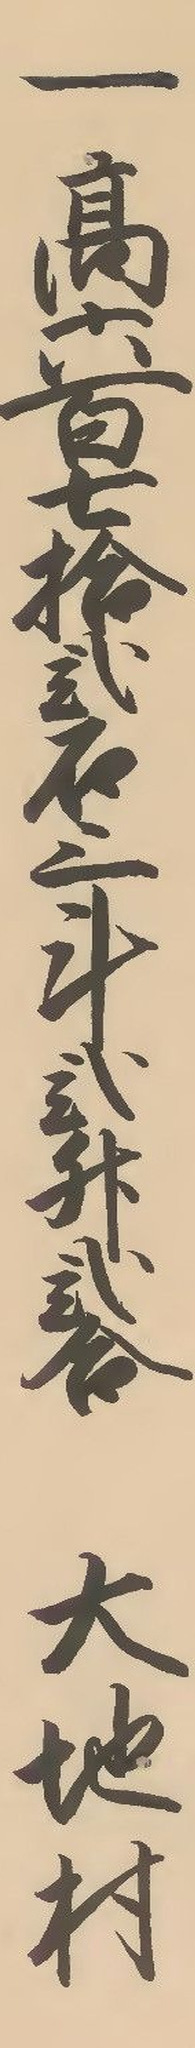一高六百七拾弐石三斗弐升弐合大地村
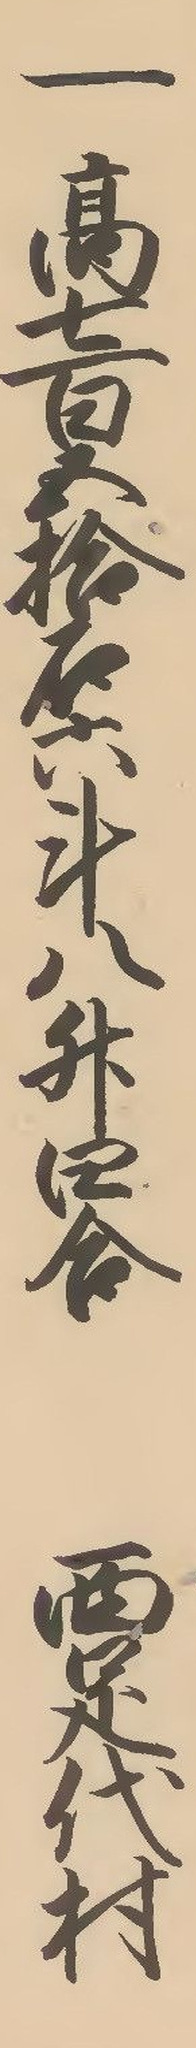一高七百五拾石六斗八升四合西足代村

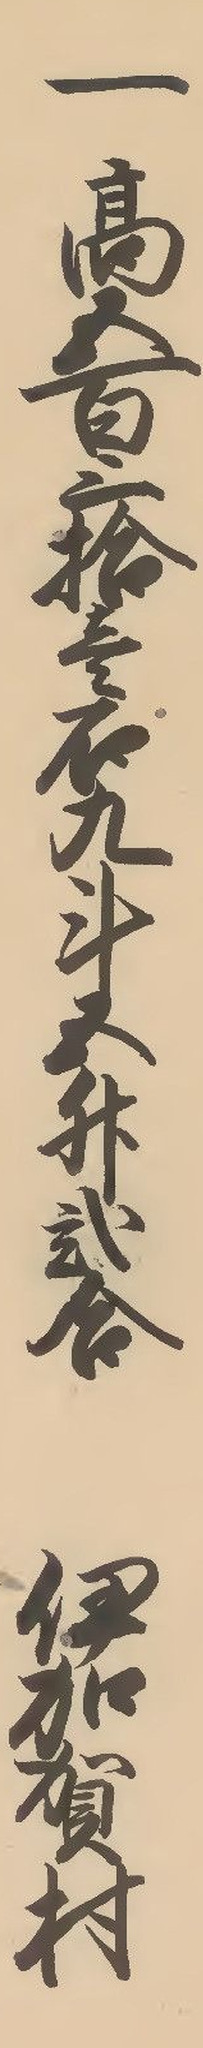一高五百三拾壱石九斗五升弐合伊加賀村
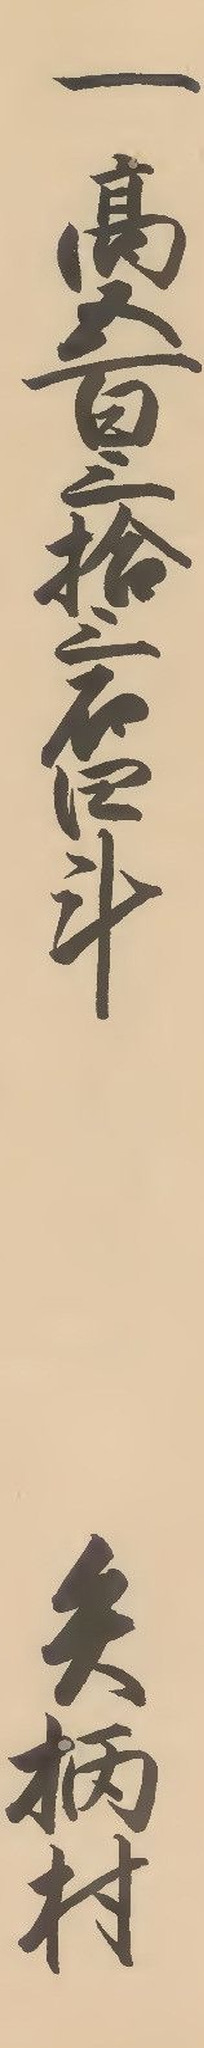一高五百三拾三石四斗矢柄村
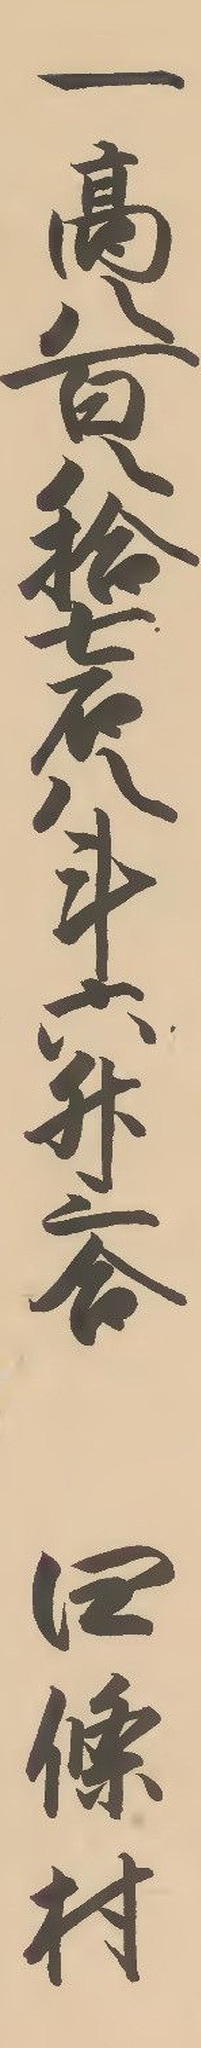一高八百八拾七石八斗六升三合四条村
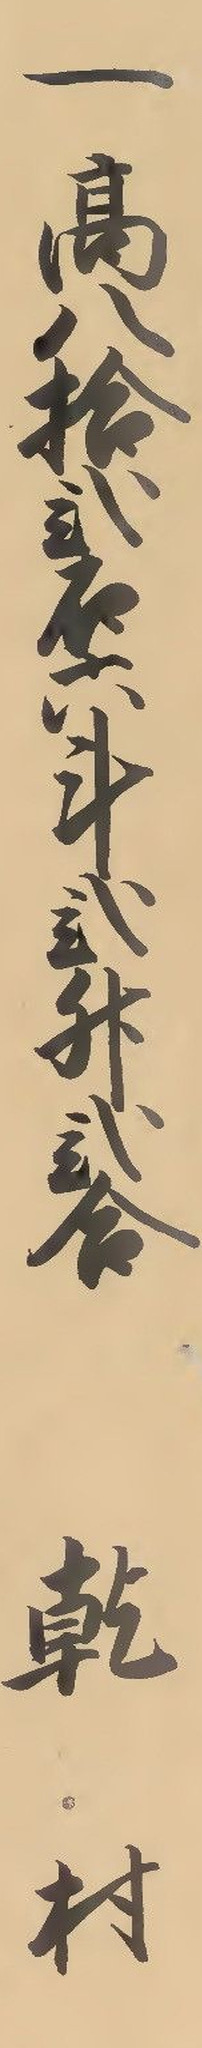一高八拾弐石六斗弐升弐合乾村
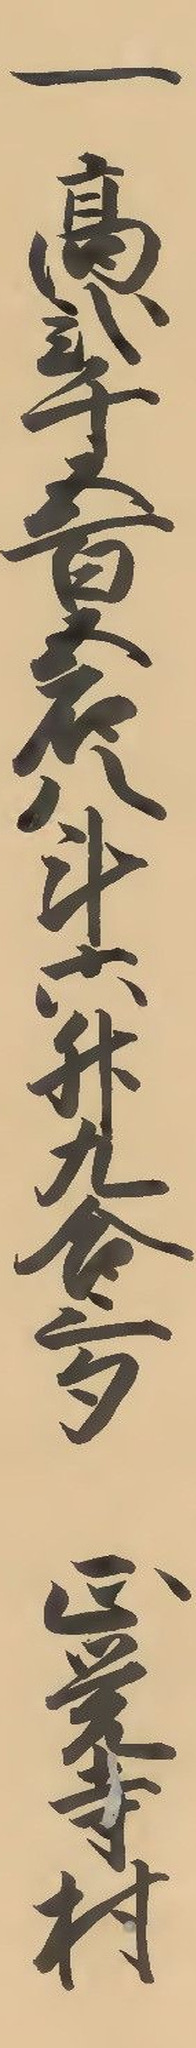一高弐千五百五石八斗六升九合三勺正覚寺村
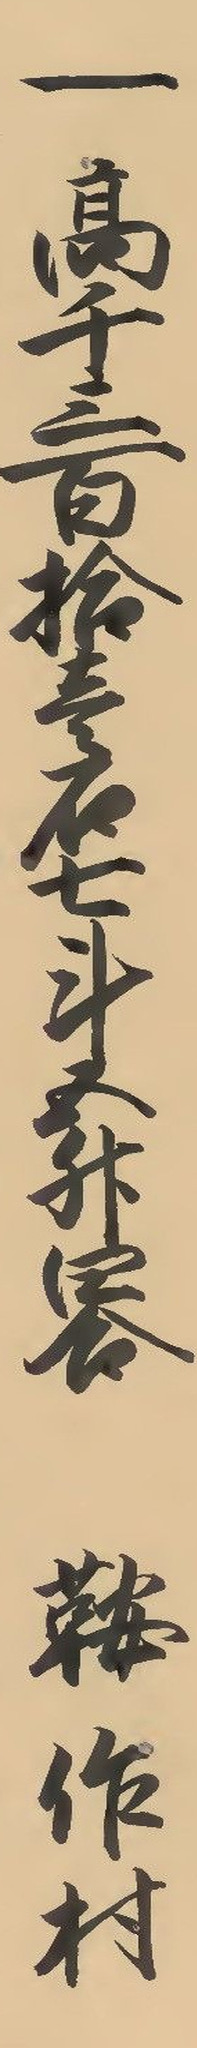一高千三百拾壱石七斗五升四合鞍作村

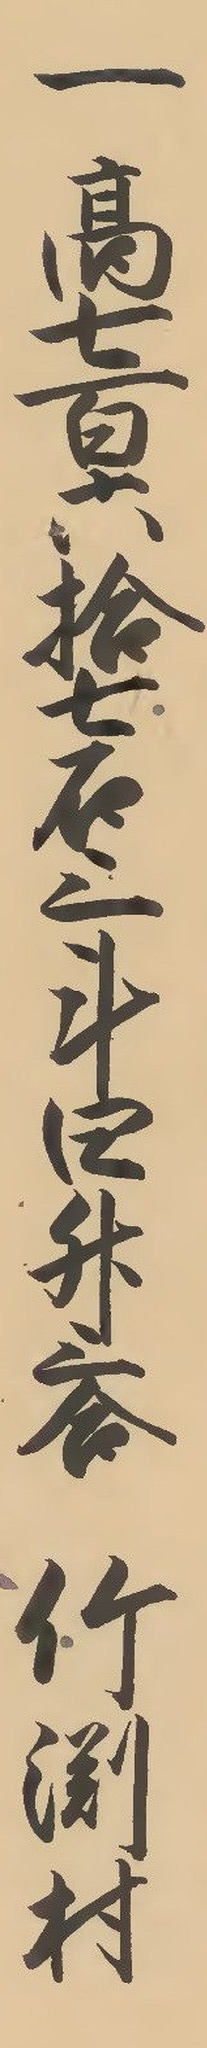一高七百六拾七石三斗四升三合竹淵村
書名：河内国郷帳
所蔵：国立公文書館 National Archives of Japan
